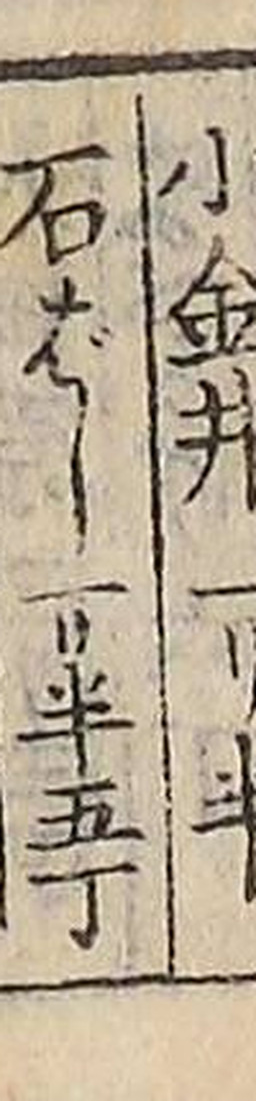石ばし一リ半五丁
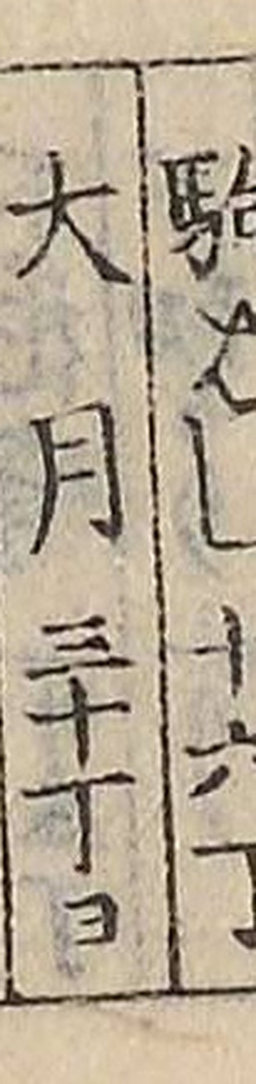大月三十丁ヨ
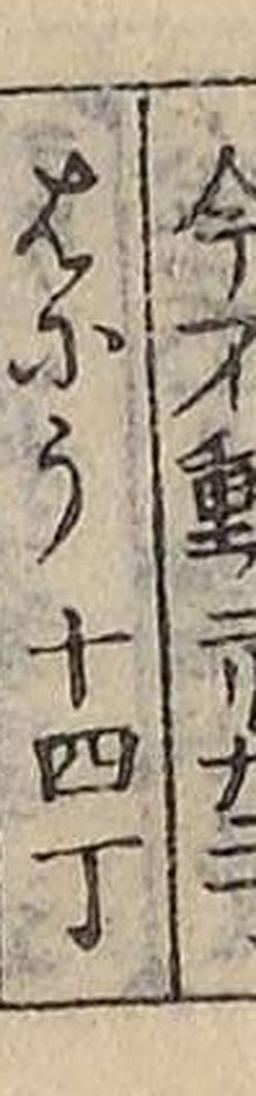はにう十四丁
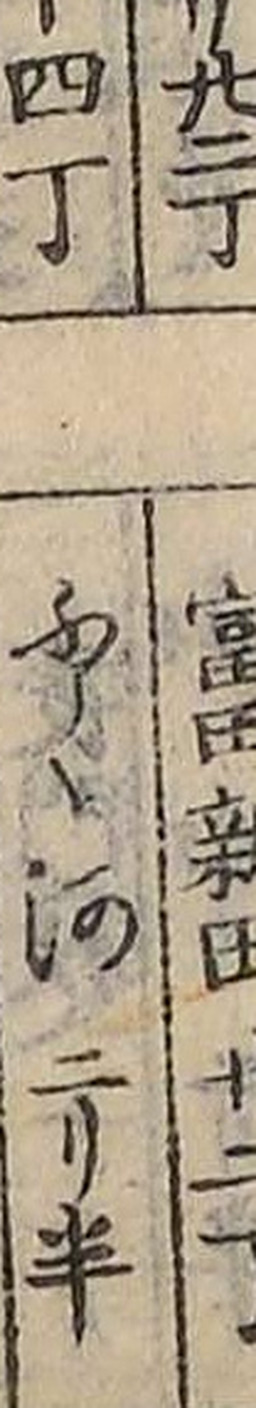ふく河二リ半
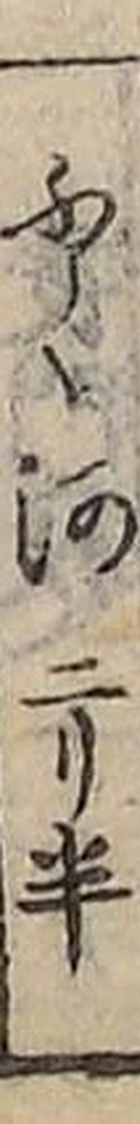ふく河二リ半
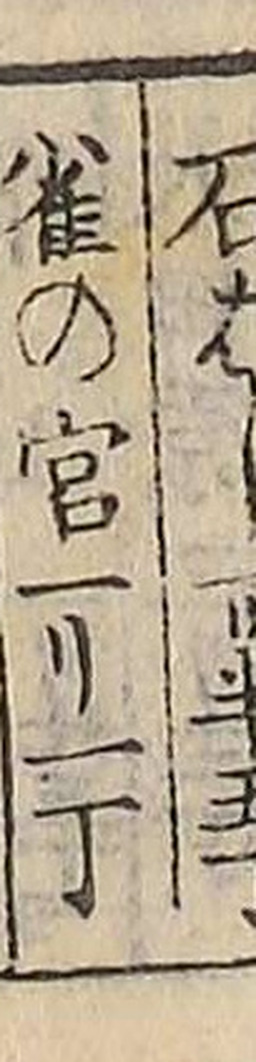雀の宮一リ一丁
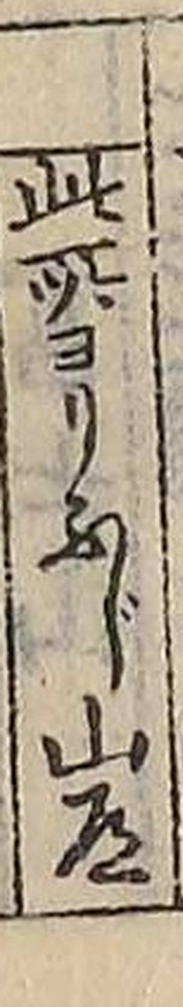此所ヨリふじ山道
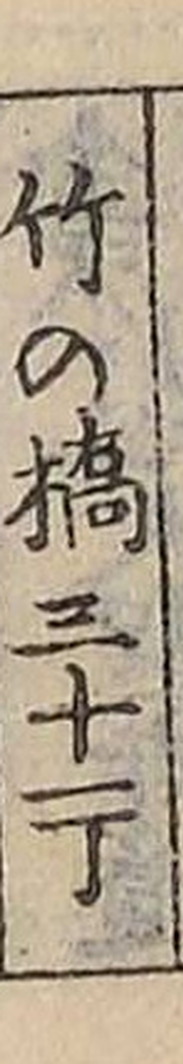竹の橋三十一丁
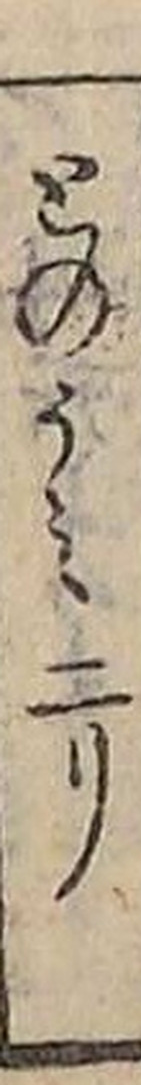とのうみ二リ
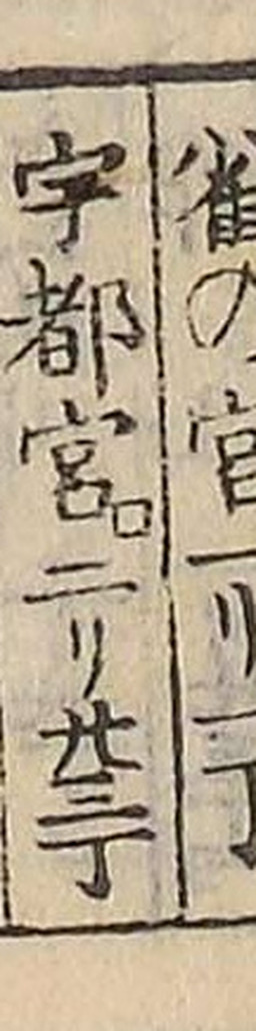宇都宮▫二リ廿三丁
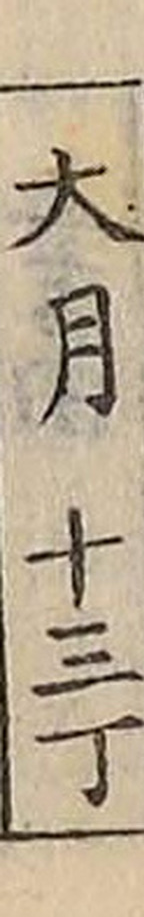大月十三丁
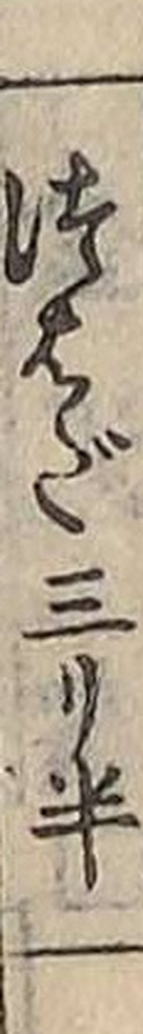つはだ三リ半
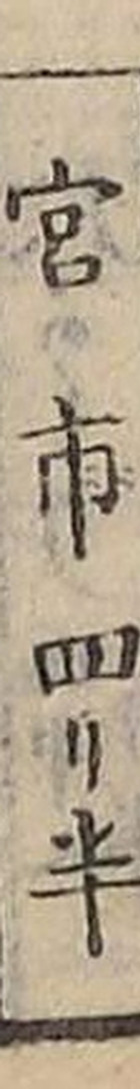宮市四リ半
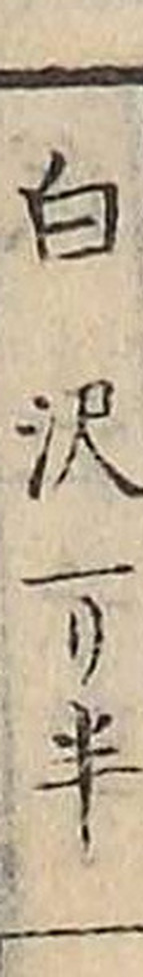白沢一リ半
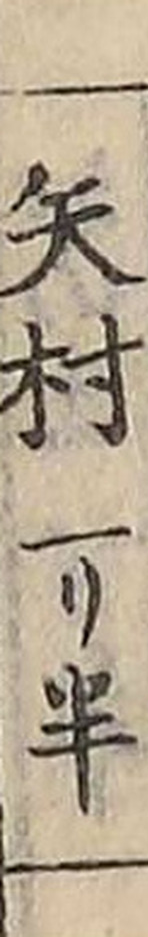矢村一リ半

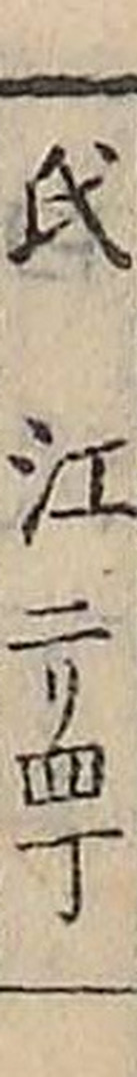氏江二リ四丁
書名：旅行用心集
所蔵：神戸大学附属図書館 国文学研究資料館
